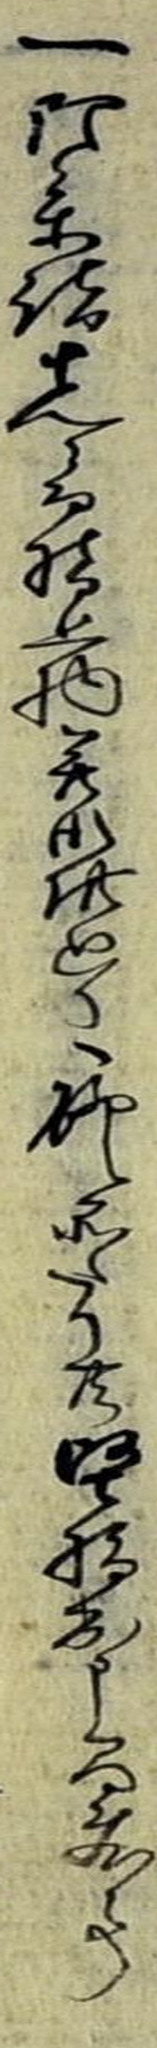一御参詣先ニ而指上物并御供廻りへ聊之品たり共堅指出申間敷事
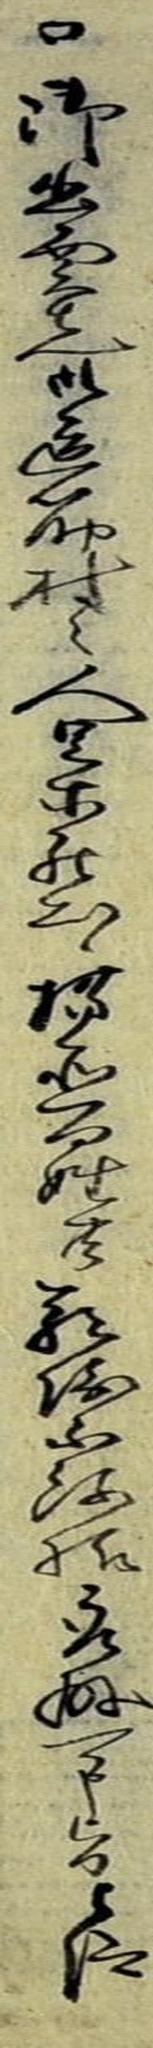〇御出殿先御道筋村々人足等罷出候場所百姓共難儀不致様取扱可申旨被仰
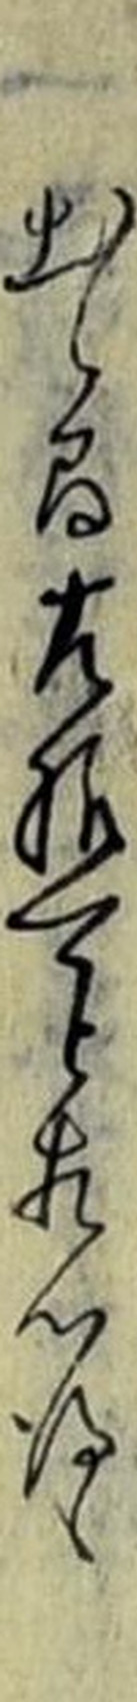出候間左様可被相心得候
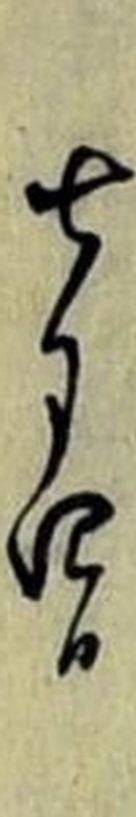七月四日
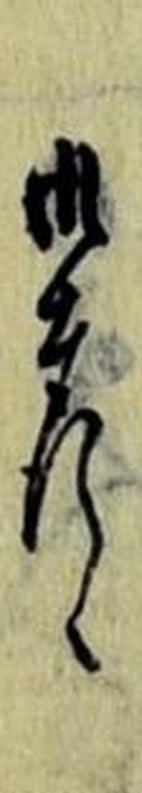御奉行へ
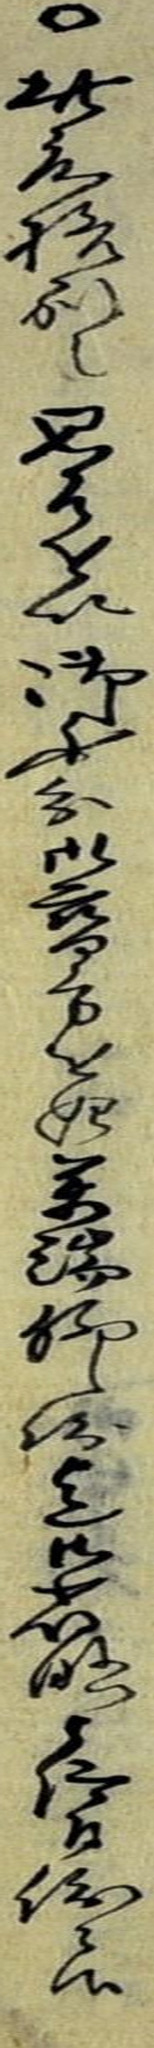〇此度格別之思召を以御身分御暮方を始万端聊之儀迄御省略被仰付候
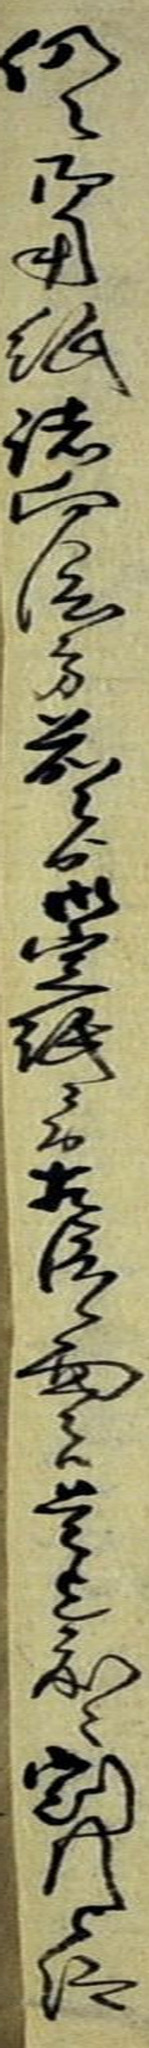仍之御用紙諸向渡方前々ゟ御定紙ニ而相渡候面々ハ是迄度々割引被仰
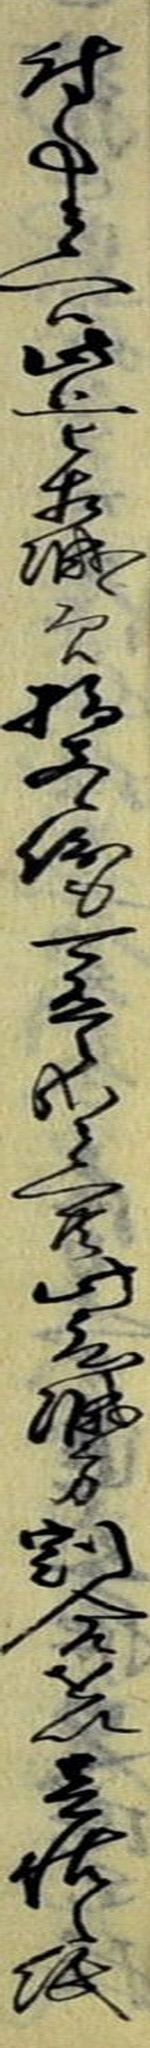付事ニ候ヘハ此上被相減候而ハ指支候儀も可有之哉ニ候へ共此度減方割合を以壱帖之紙
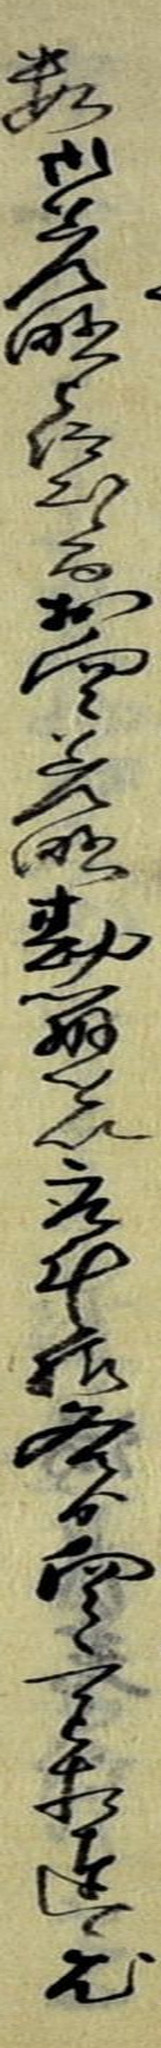数御差略被仰出候間於向々差略勘弁を以取計候様各ゟ向々へ可被相達候尤
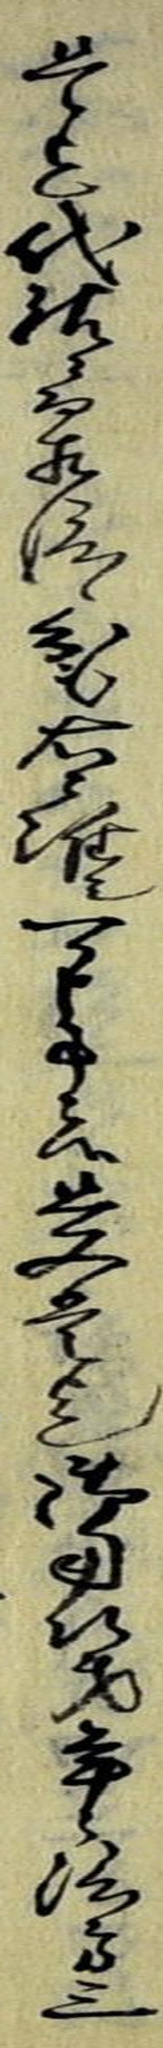是迄代銀ニ而相渡候分も右ニ准シ可申事ニ候且又是迄御用次第年々渡方三
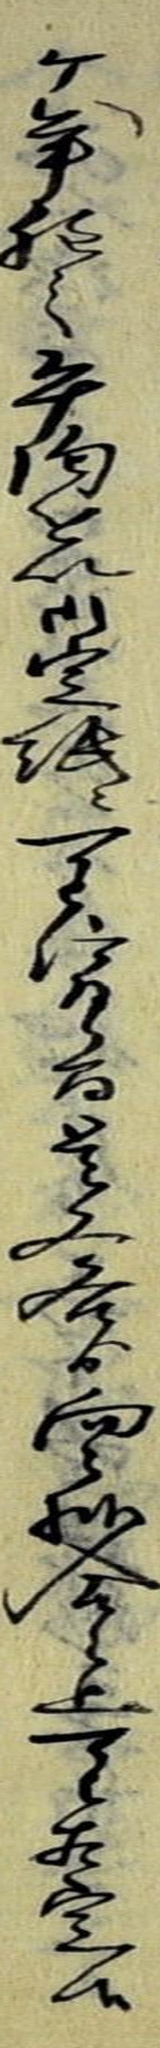ケ年程之平均を以御定紙ニ可被仰付候間是又各ゟ向々掛合之上可被相定候
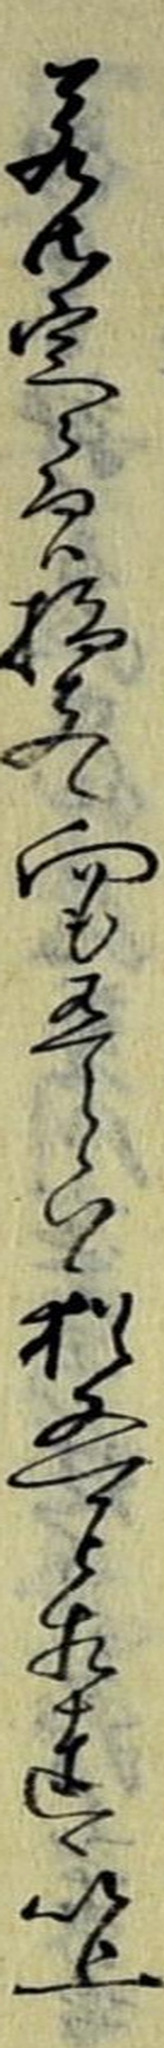若御定ニ而ハ指支候向も有之候ハヽ猶又可被相達候以上
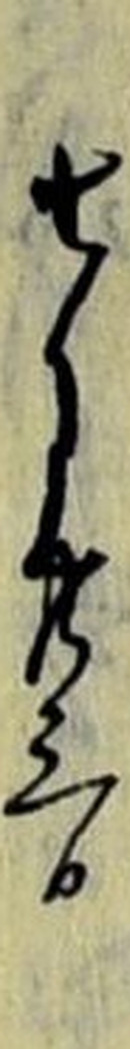七月廿三日
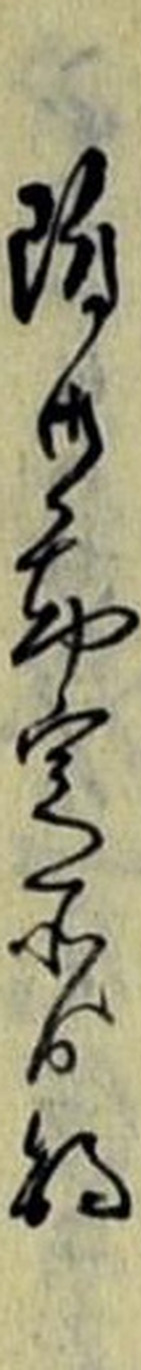付御勘定所ゟ触
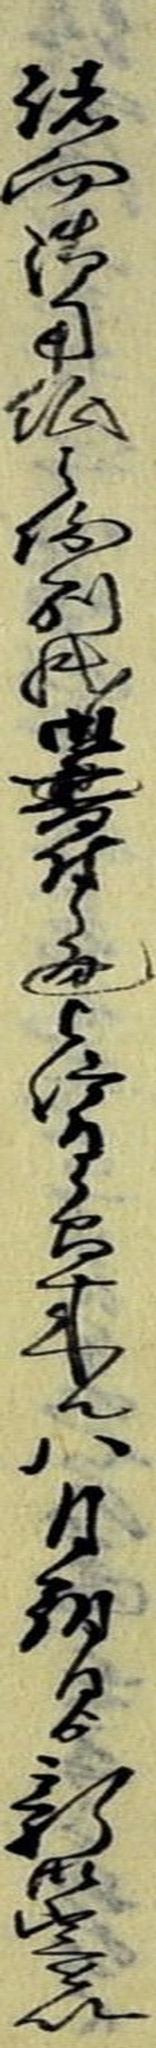諸向御用紙之儀別紙御書付之通被仰付候間来ル八月朔日ゟ新御定を以
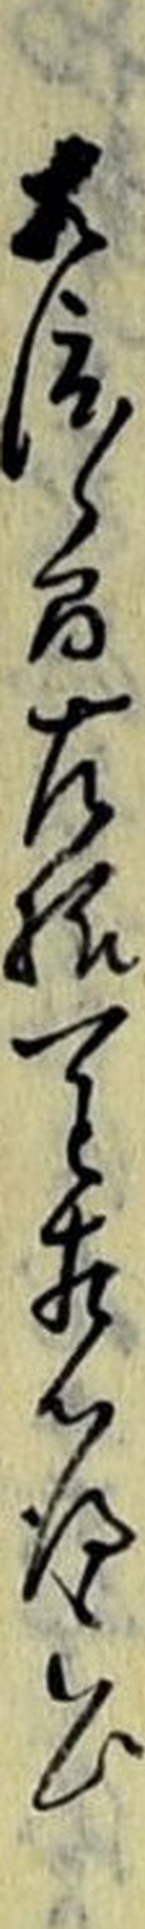相渡候間左様可被相心得候以上
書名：命令之部 三
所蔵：福井県文書館 Fukui Prefectural Archives
